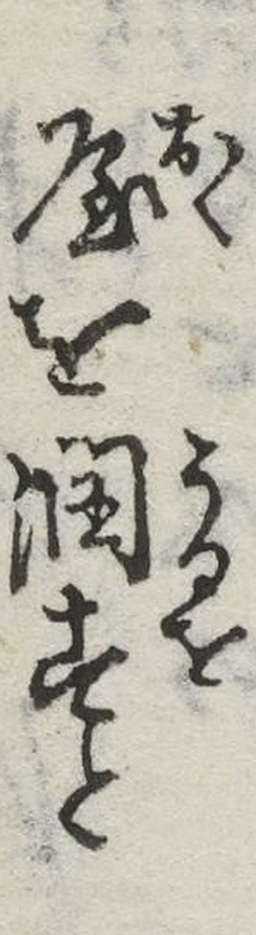屋を潤すと
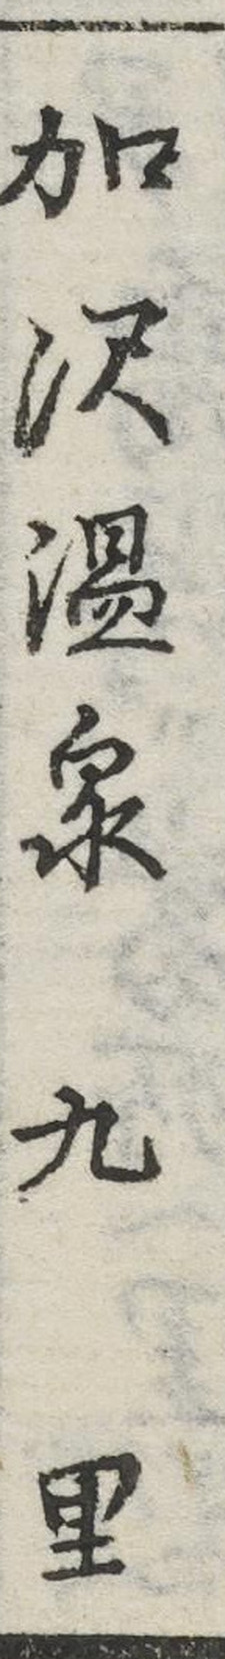加沢温泉九里
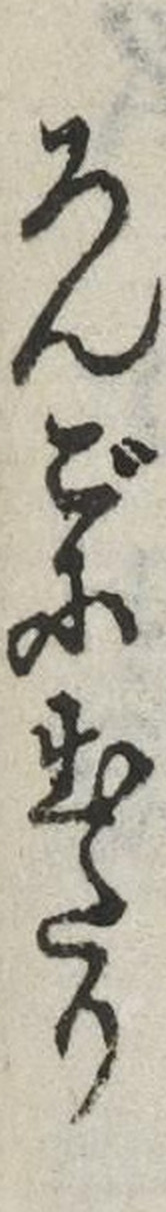ろんごに出たり
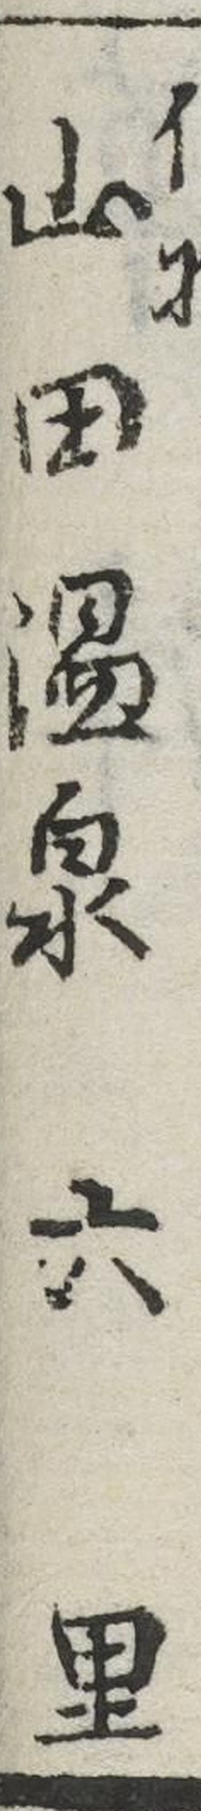山田温泉六里
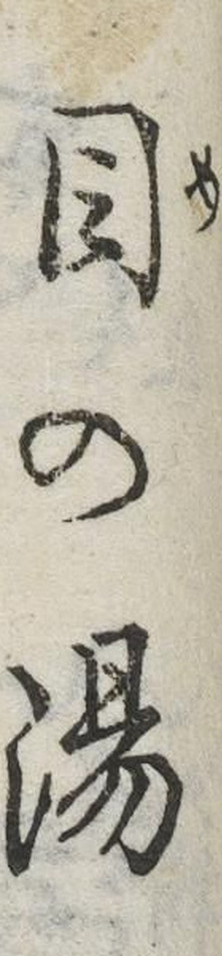目の湯
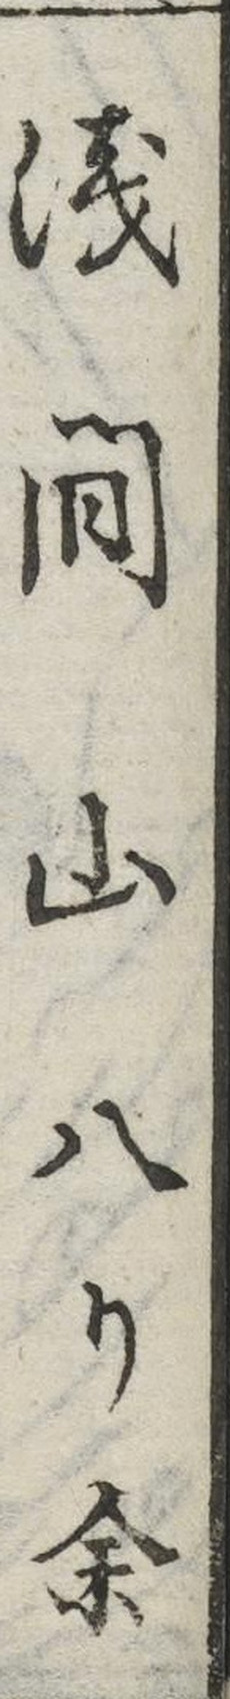浅間山八り余
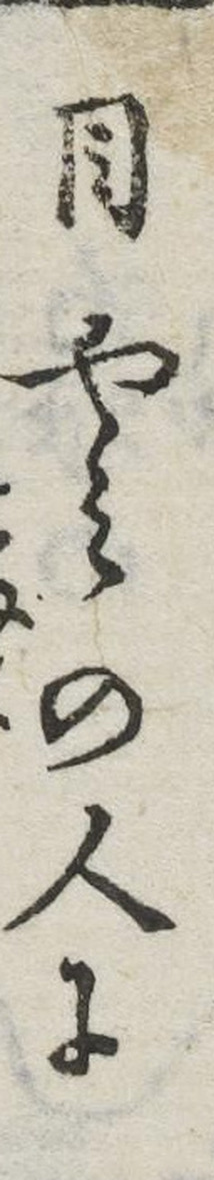目やみの人に
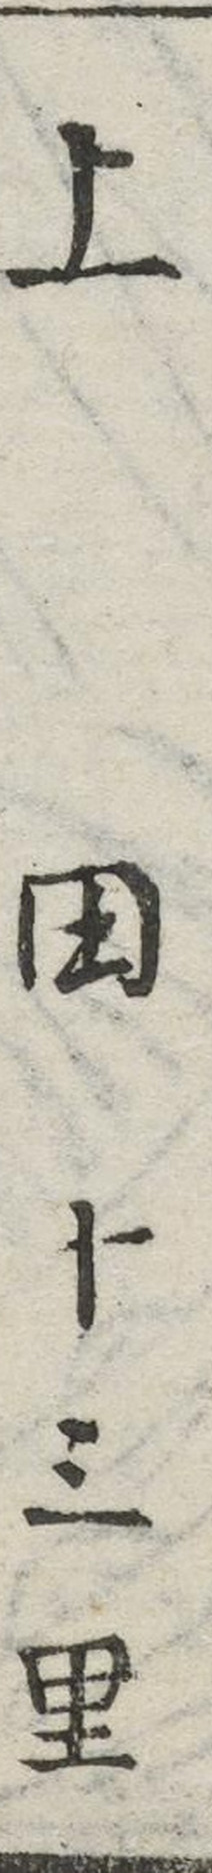上田十三里
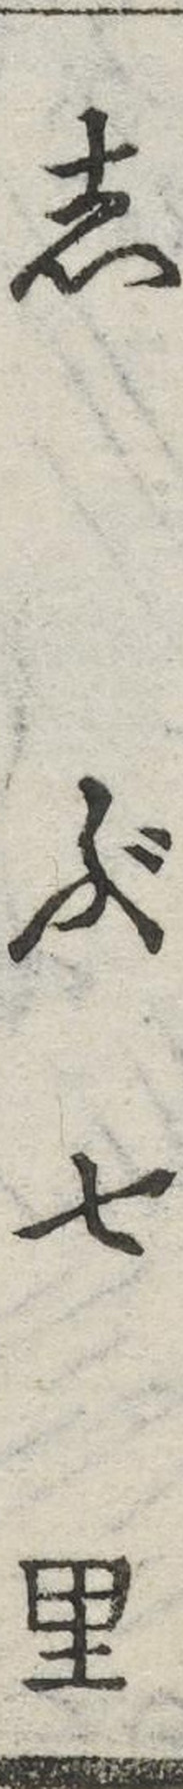志ぶ七里
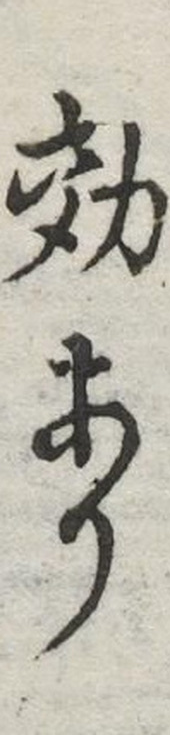効あり
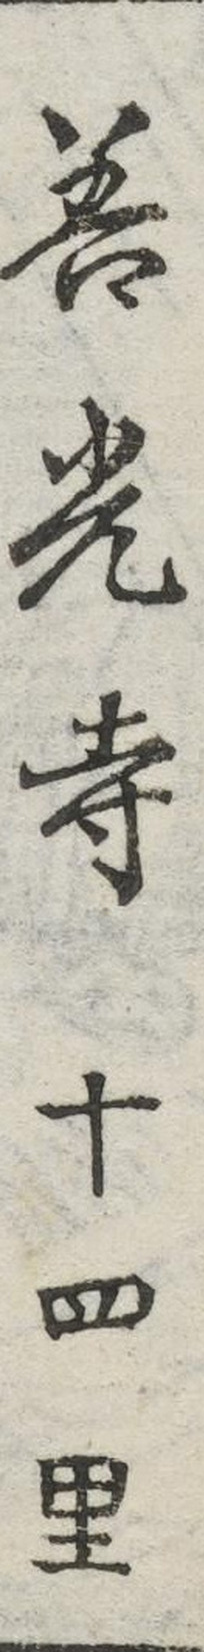善光寺十四里
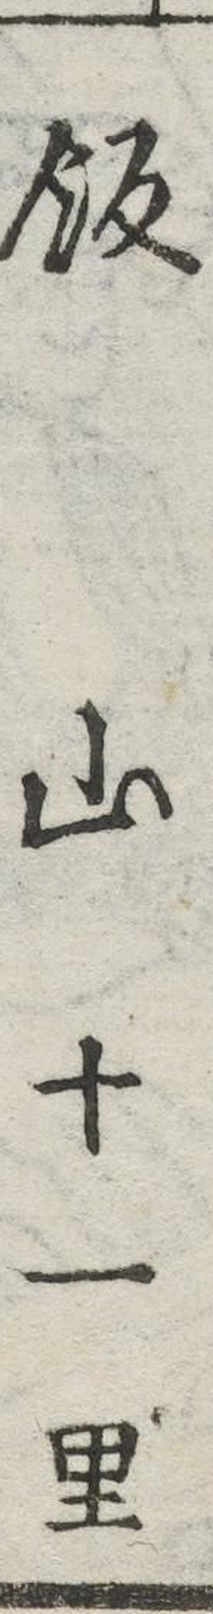飯山十一里
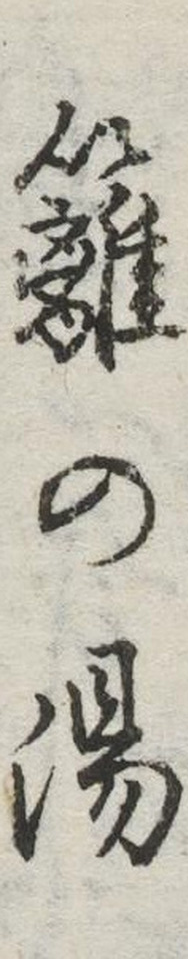籬の湯
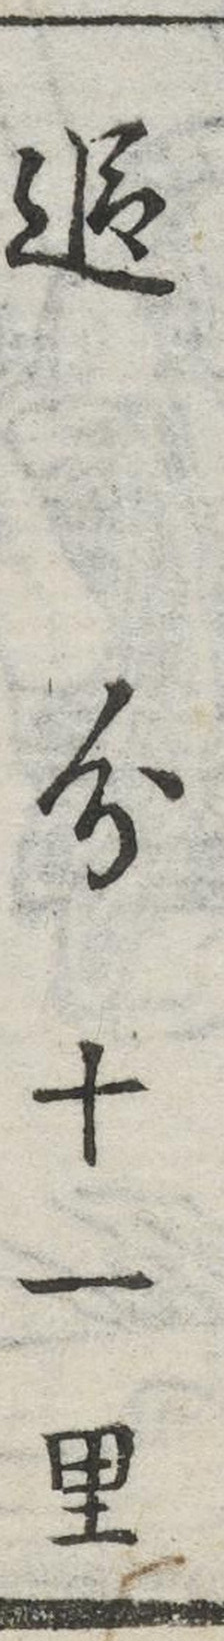飯山十一里
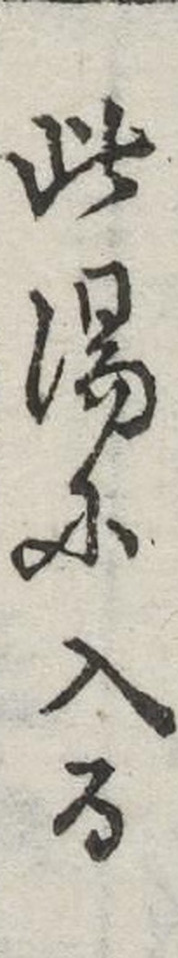此湯に入る
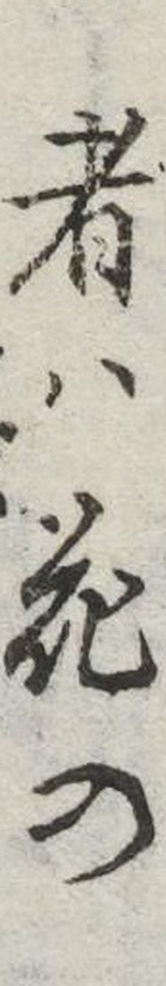者は花の
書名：諸國温泉遊覽記　全
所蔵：東京大学地震研究所図書室 Earthquake Research Institute Library, The University of Tokyo, JAPAN
